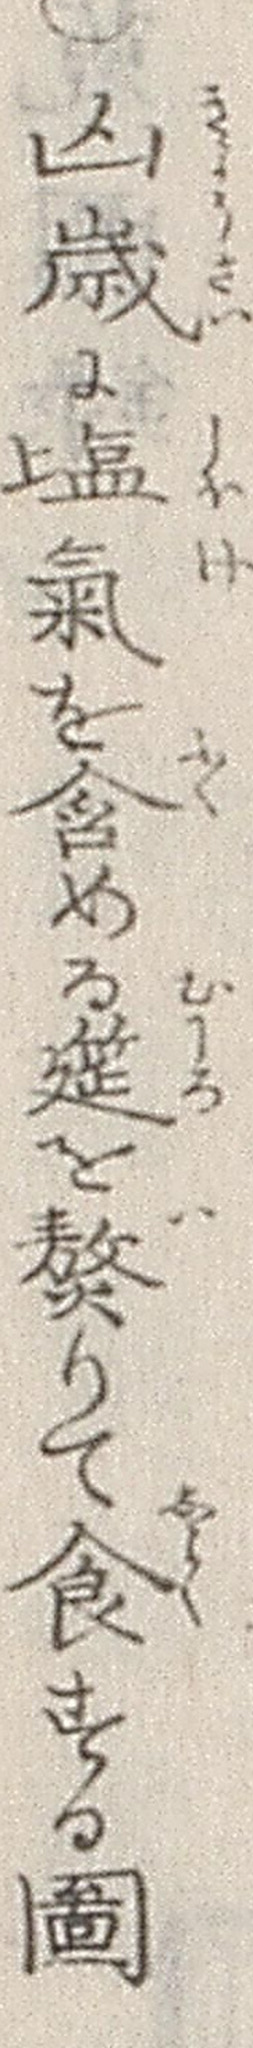〇凶歳に塩気を含める筵を熬りて食する図
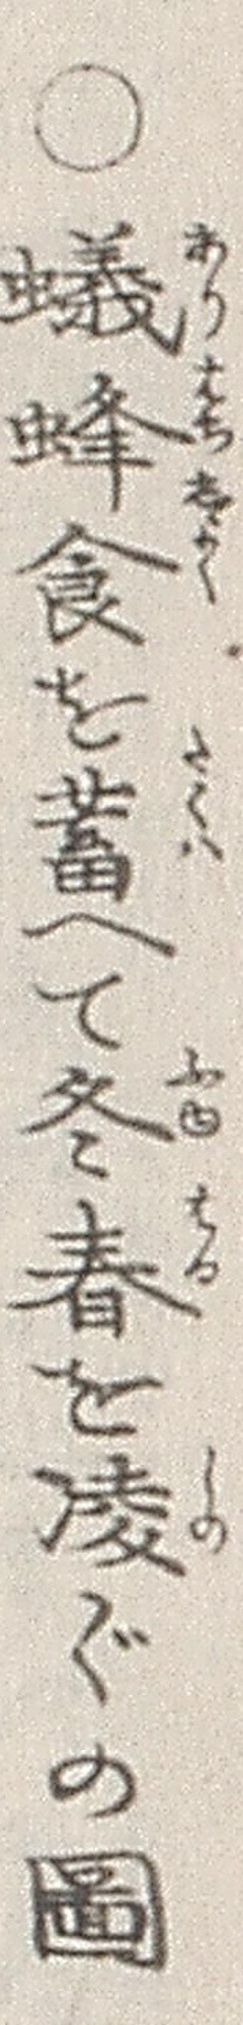〇蟻蜂食を蓄へて冬春を凌ぐの図
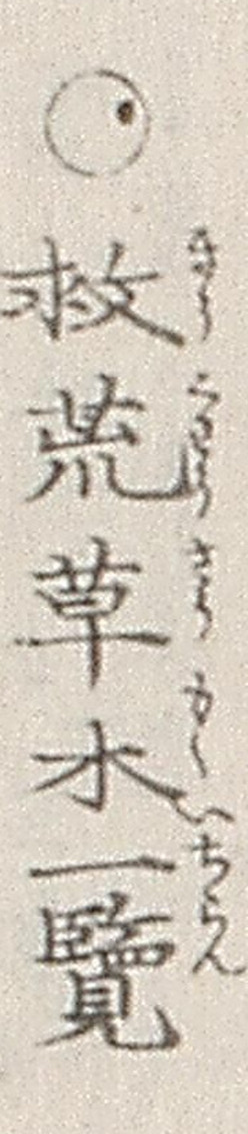〇救荒草木一覧
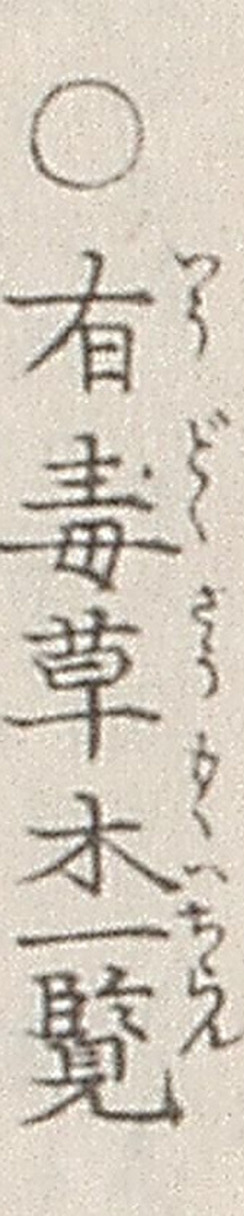〇有毒草木一覧
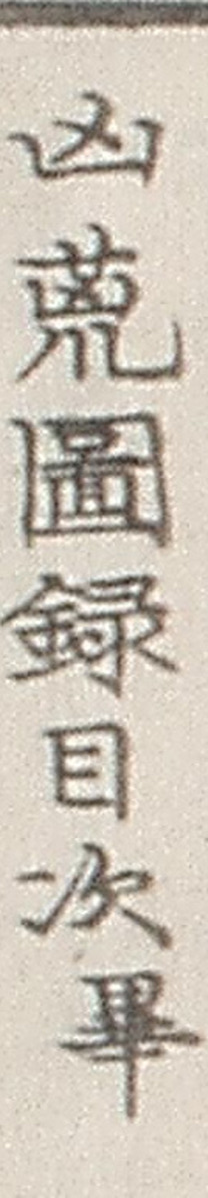凶荒図録目次畢

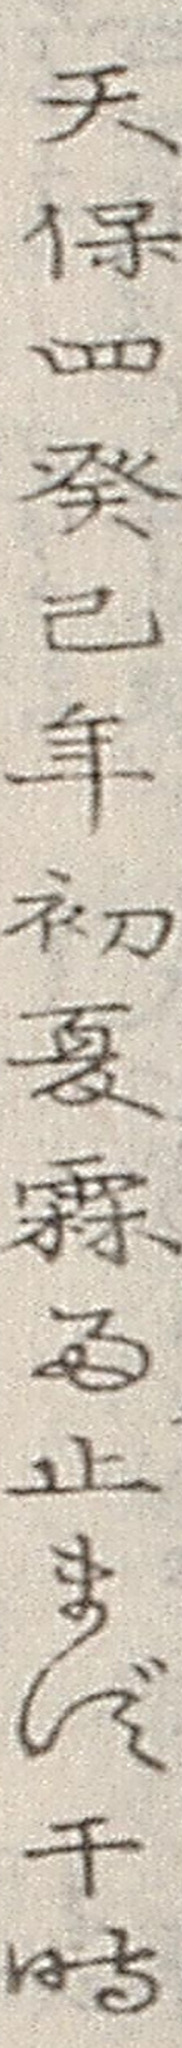天保四癸巳年初夏霖雨止まず干時
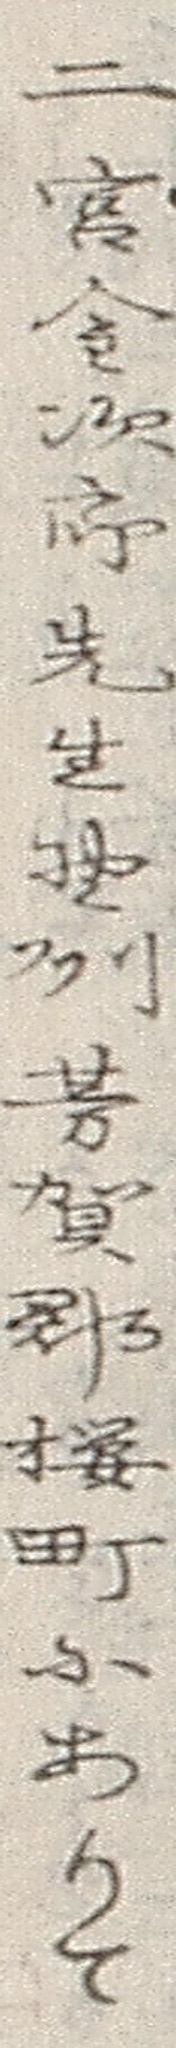二宮金次郎先生野州芳賀郡桜町にありて
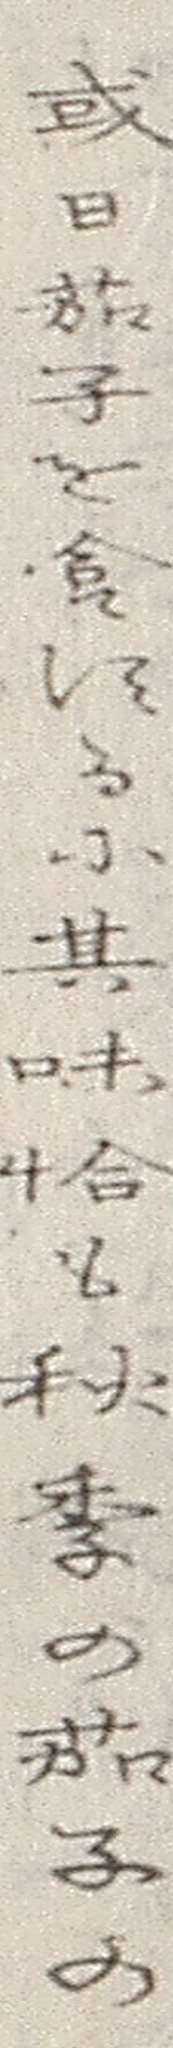或日茄子を食するに其味恰も秋季の茄子の.
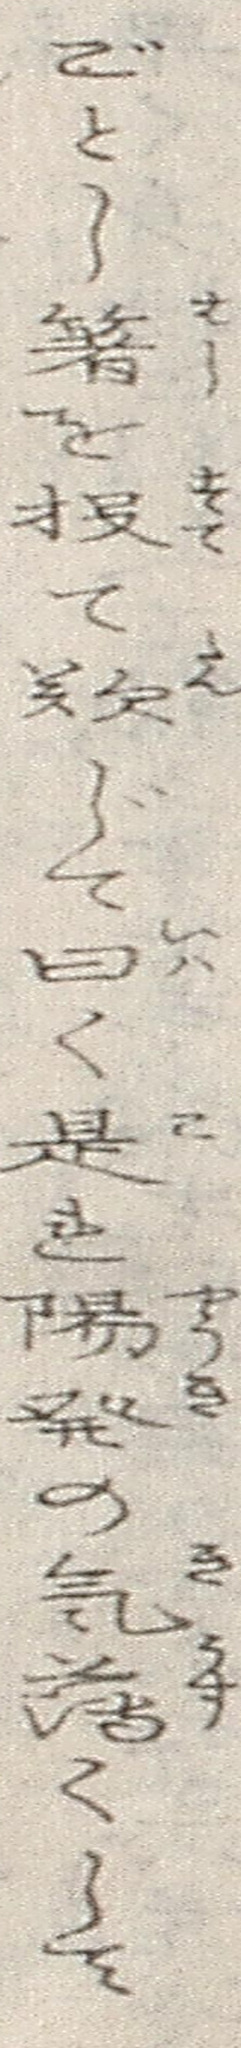ごとし箸を投て歎じて曰く是れ陽発の気薄くして
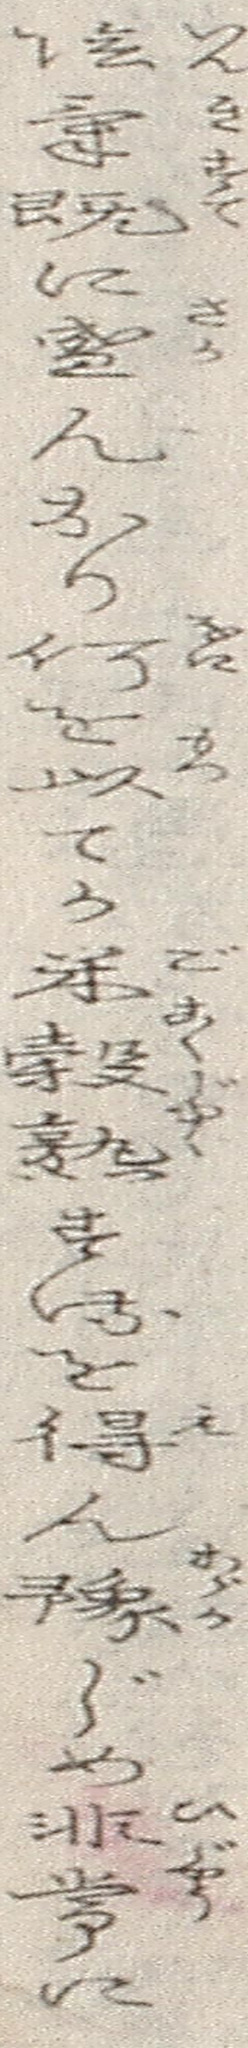陰気既に盛んなり何を以てか米穀熟するを得ん豫じめ非常に
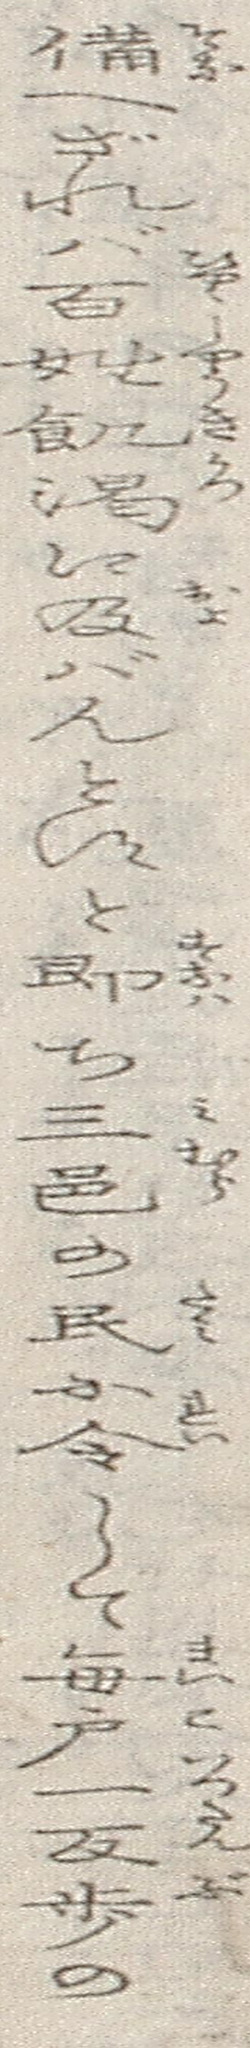備へざれば百姓飢渇に及ばんとすと即ち三邑の民に令して毎戸一反歩の
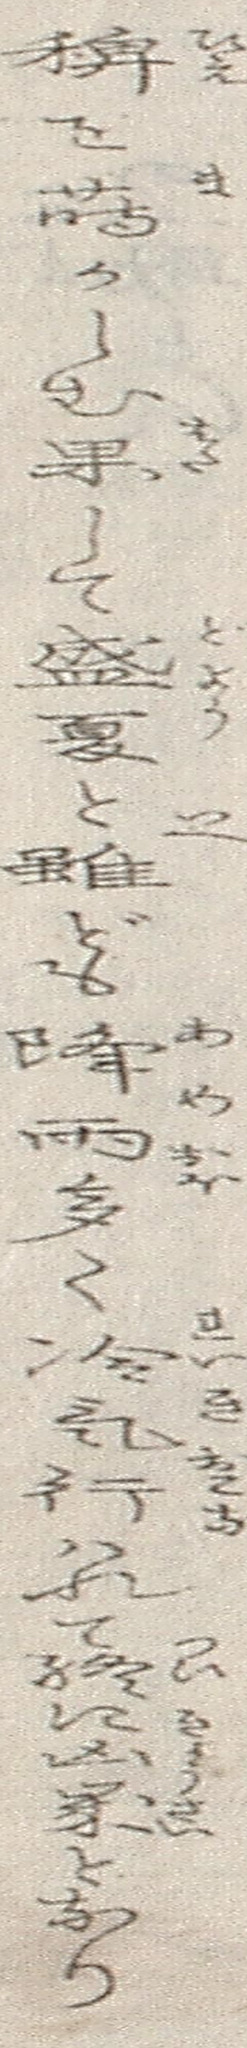稗を蒔かしむ果して盛夏と雖ども降雨多く冷気行はれて終に凶歳となり
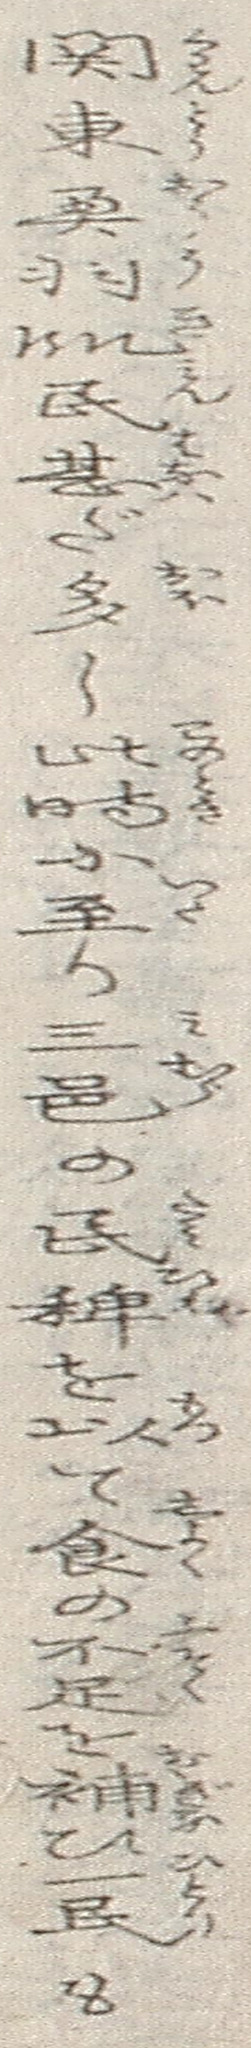関東奥羽飢民甚だ多し此時に至り三邑の民稗を以て食の不足を補ひ一民も
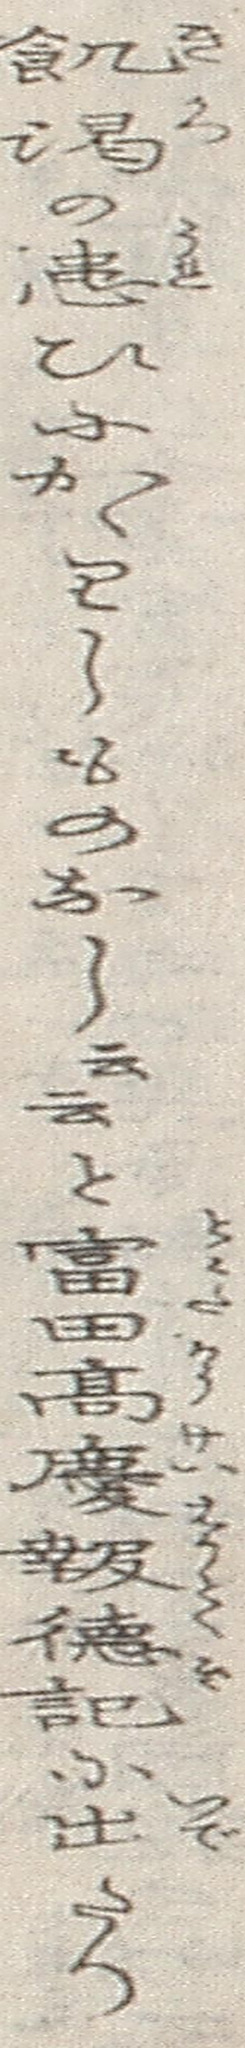飢渇の患ひにかかりしものなし云云と富田高慶報徳記に出たり

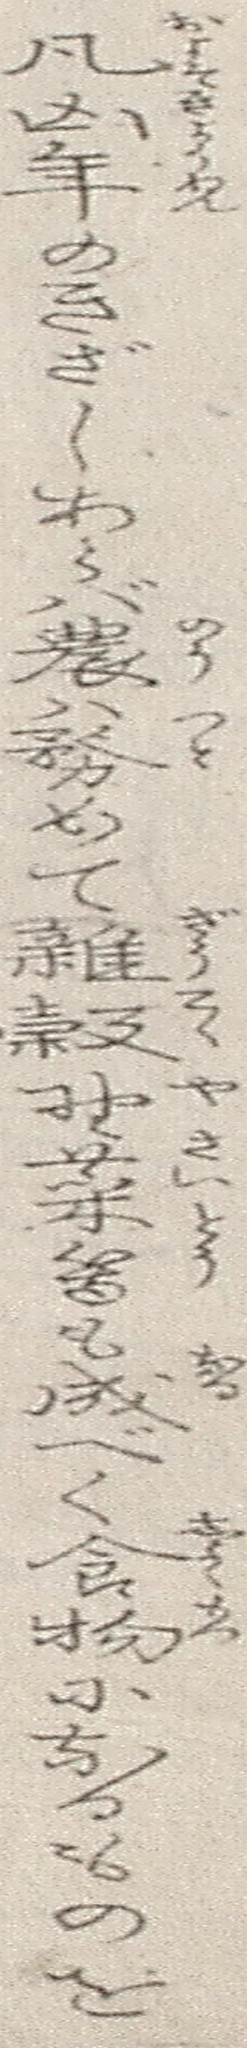凡凶年のきざしあらば農は努めて雑穀野菜等も成べく食物になるものを
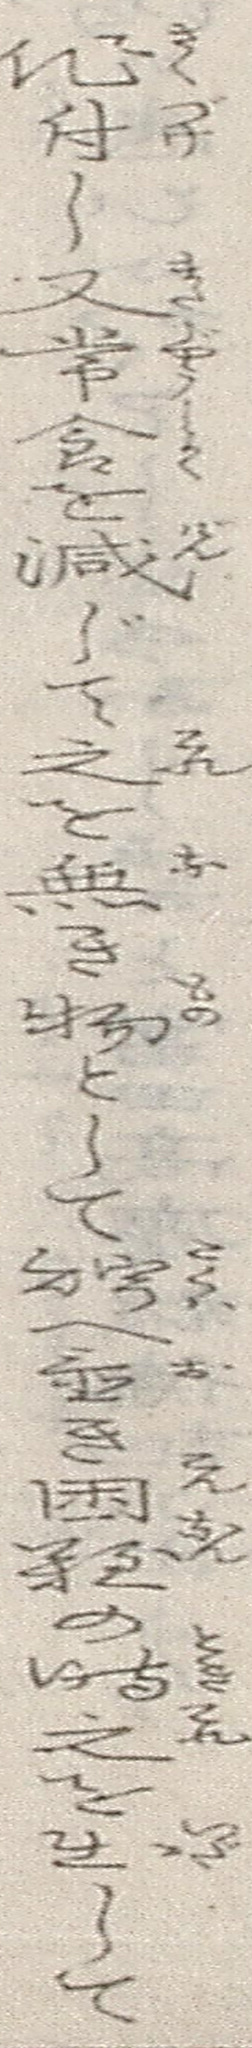作付し又常食を減じて之を無き物として貯へ置き困難の時之を出して
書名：凶荒図録　完
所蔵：東京大学地震研究所図書室 Earthquake Research Institute Library, The University of Tokyo, JAPAN
